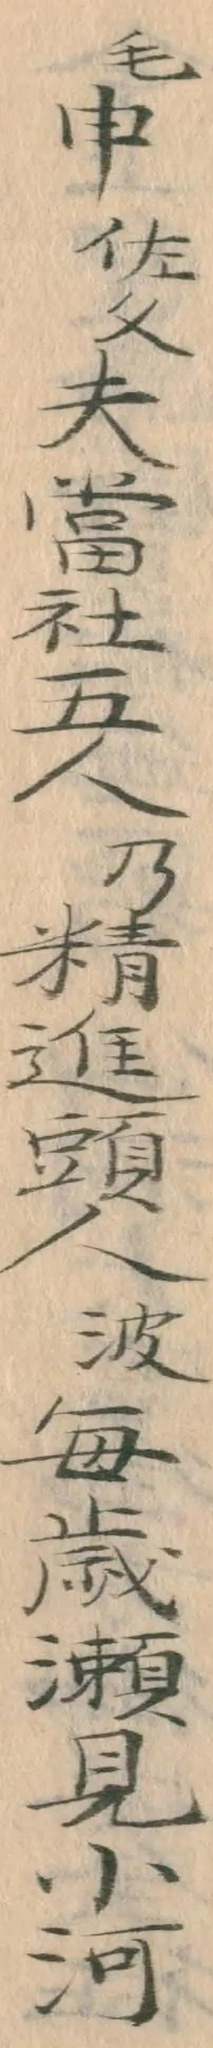毛申佐久夫當社五人乃精進頭人波毎歳瀬見小河
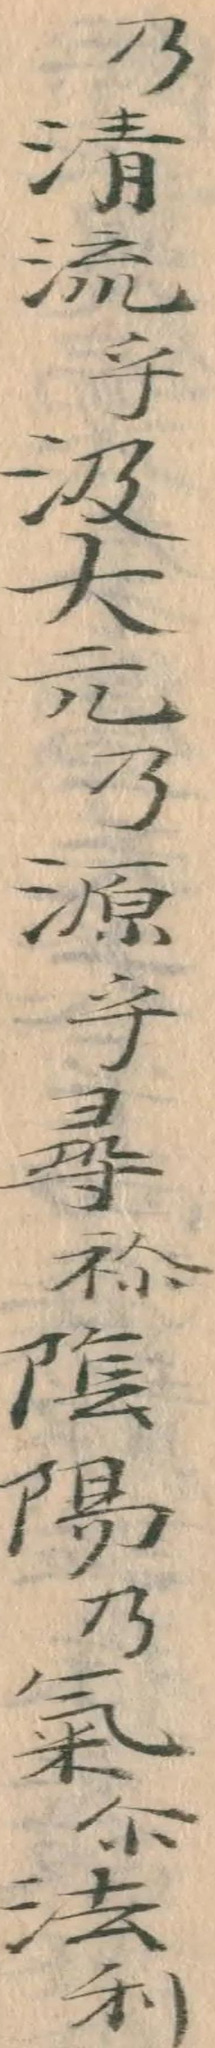乃清流乎汲大元乃源乎尋祢陰陽乃氣尒法利
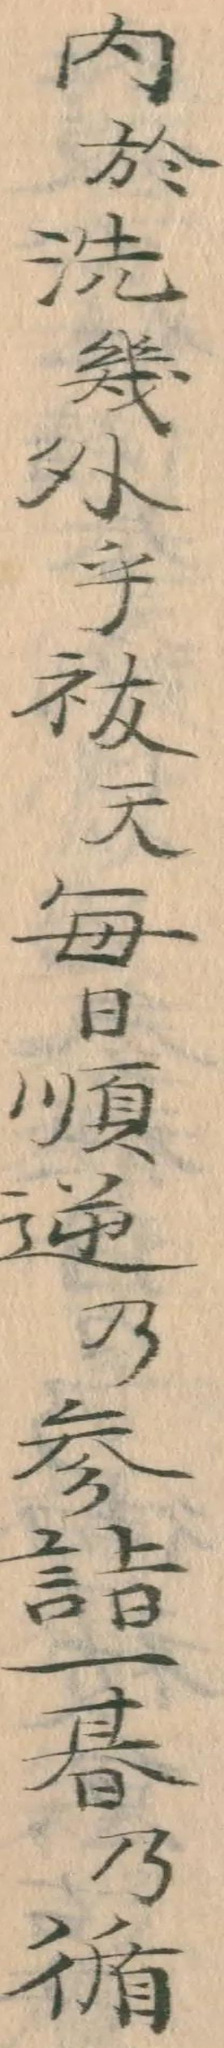内於洗幾外乎祓天毎日順逆乃参詣一暮乃循
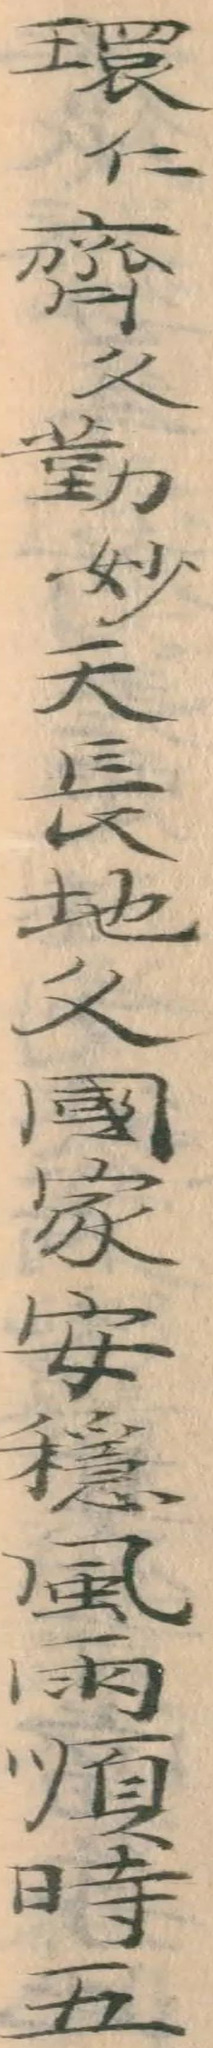環仁齋久勤妙天長地久國家安穏風雨順時五
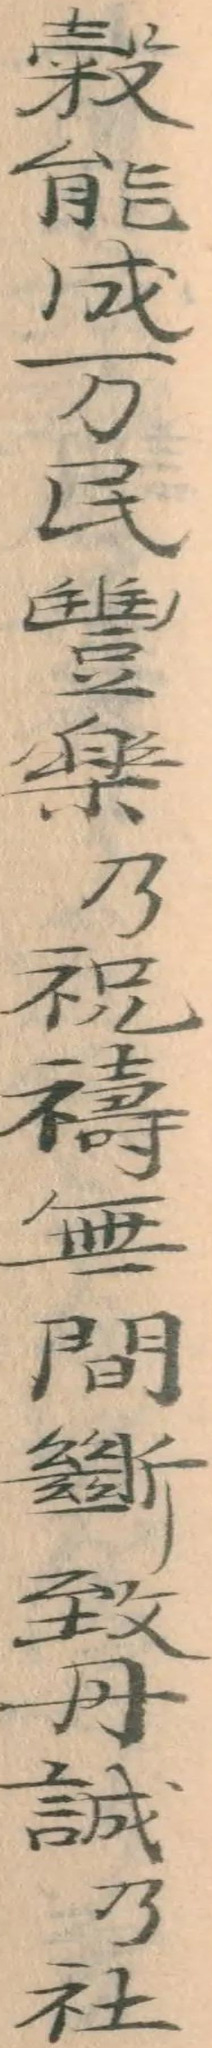穀能成万民豊楽乃祝祷無間断致丹誠乃社
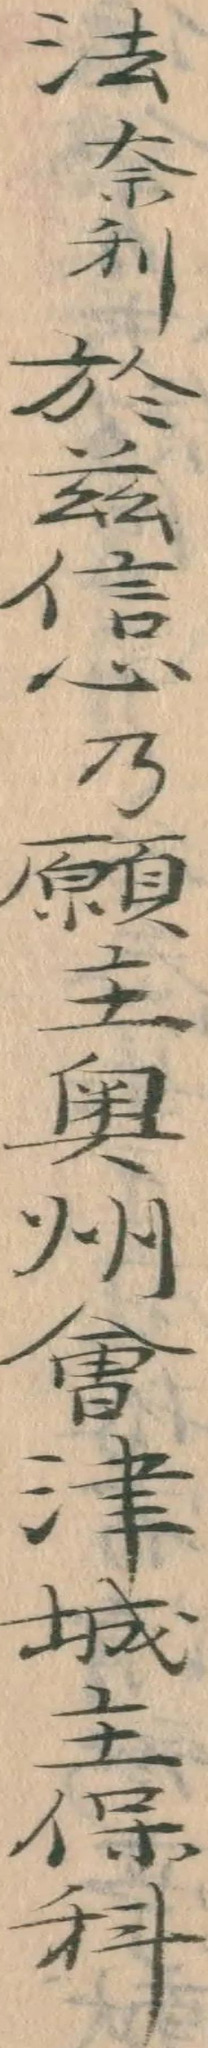法奈利於茲信心乃願主奥州會津城主保科
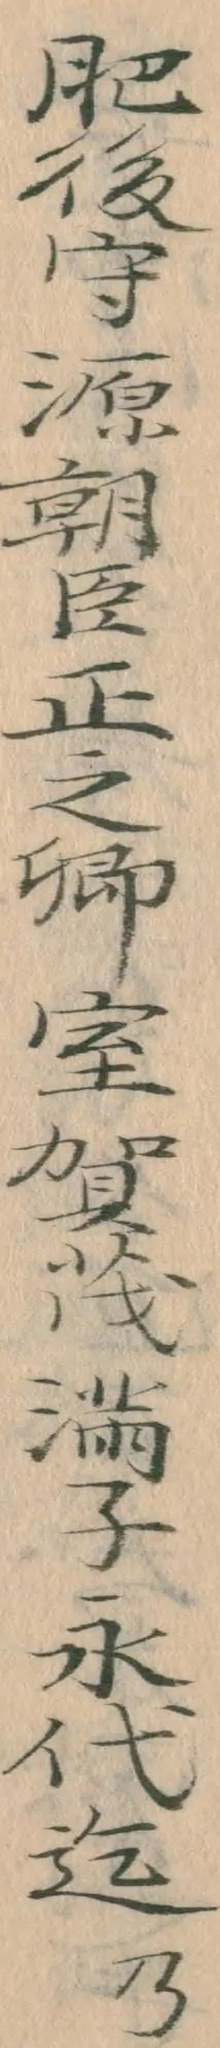肥後守源朝臣正之卿室賀茂満子永代迄乃
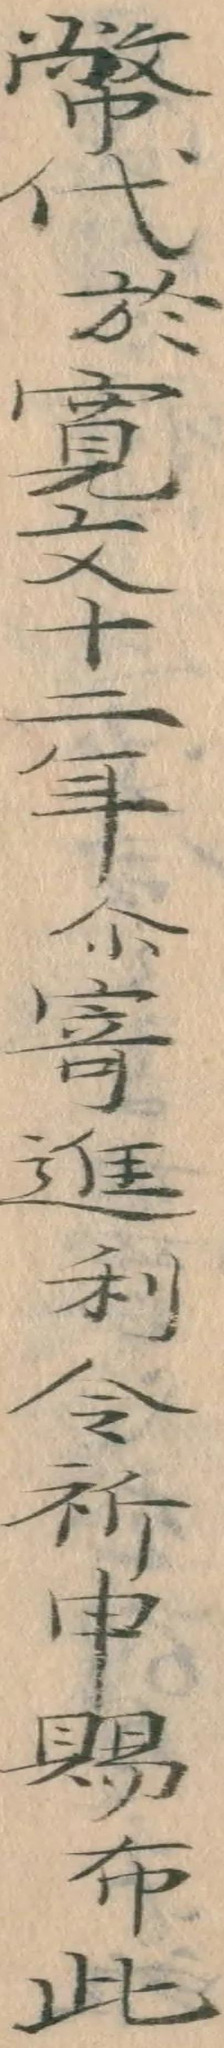幣代於寛文十二年尒寄進利令祈申賜布此
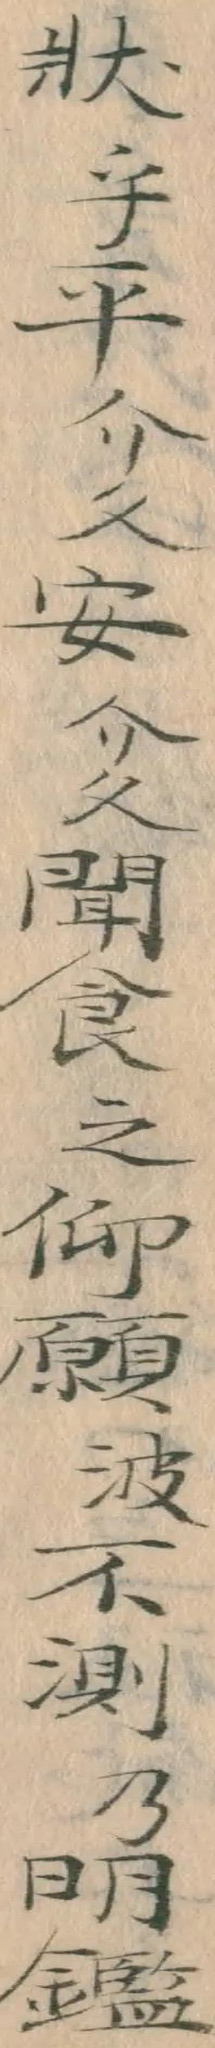状乎平介久安介久聞食之仰願波不測乃明鑑
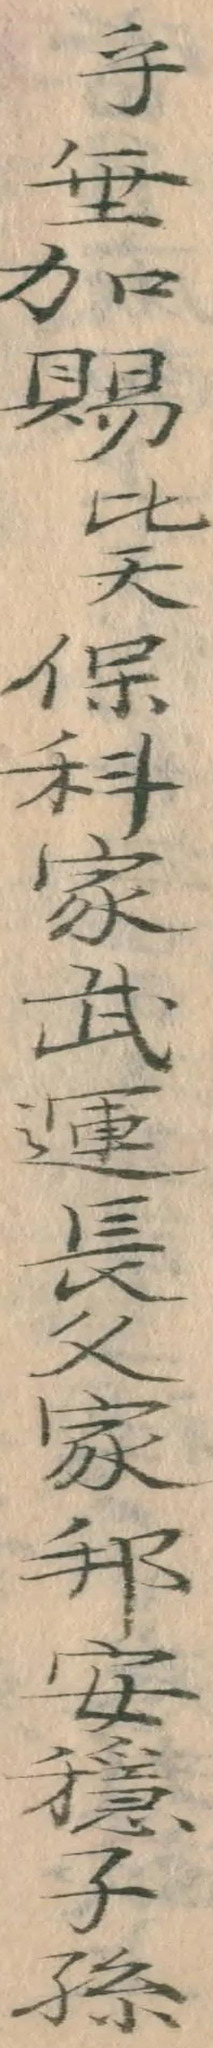乎垂加賜比天保科家武運長久家邦安穏子孫
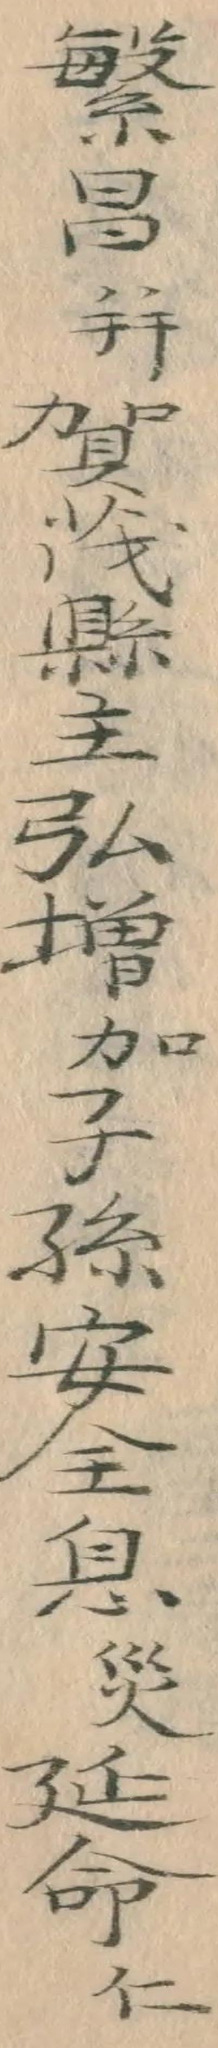繁昌并賀茂縣主弘増加子孫安全息災延命仁
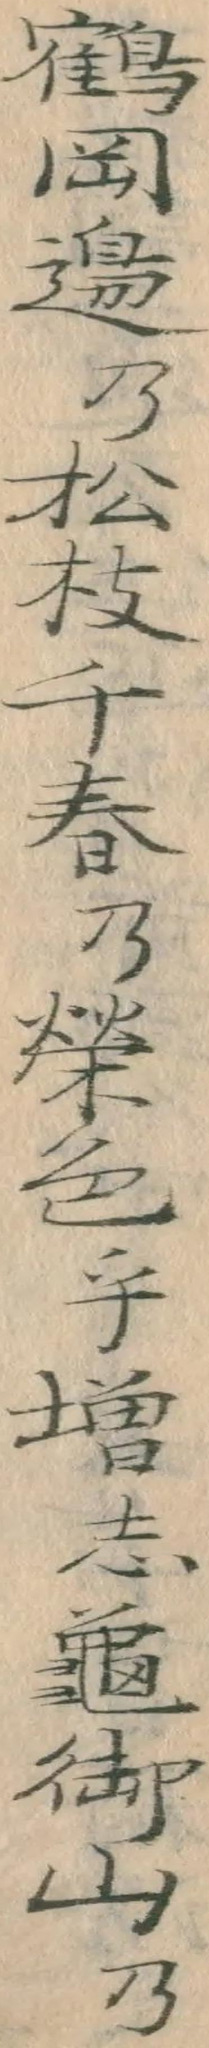鶴岡邊乃松枝千春乃榮色乎増志亀御山乃
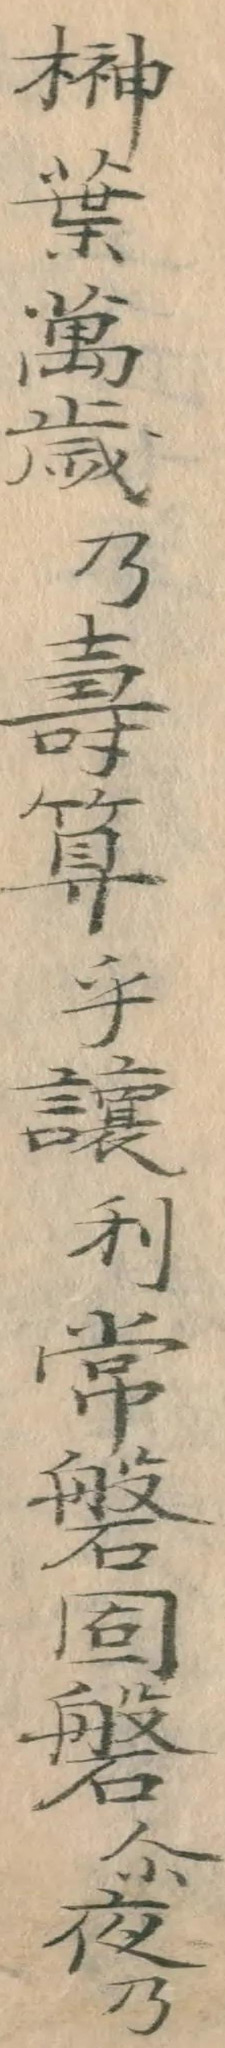榊葉萬歳乃壽算乎譲利常磐固磐尒夜乃
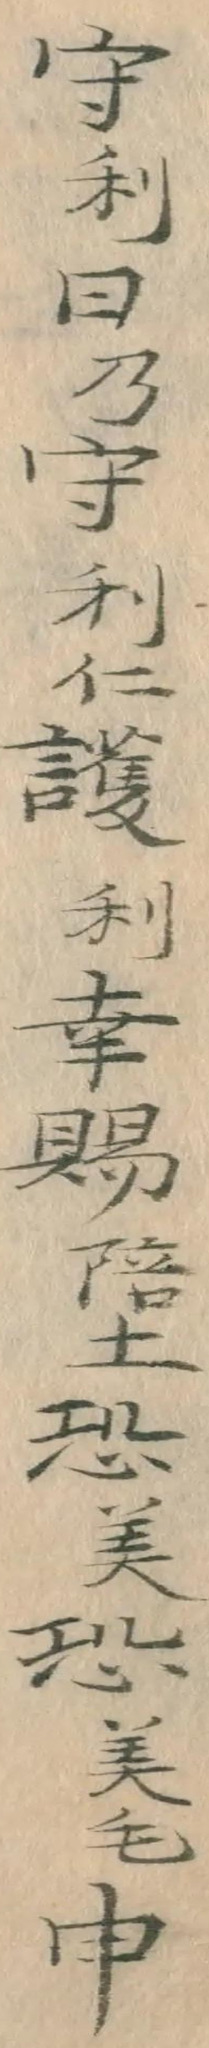守利日乃守利仁護利幸賜陪土恐美恐美毛申

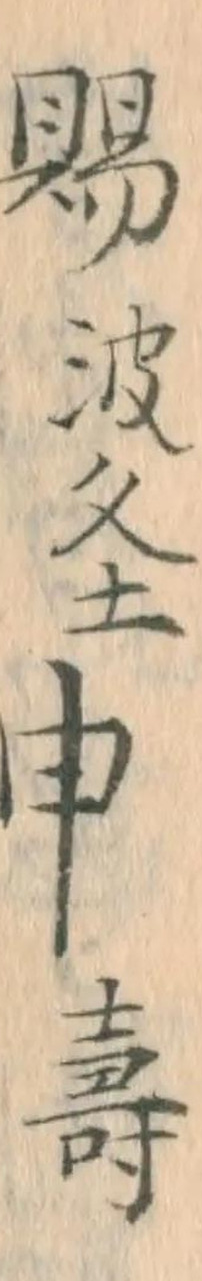賜波久土申壽
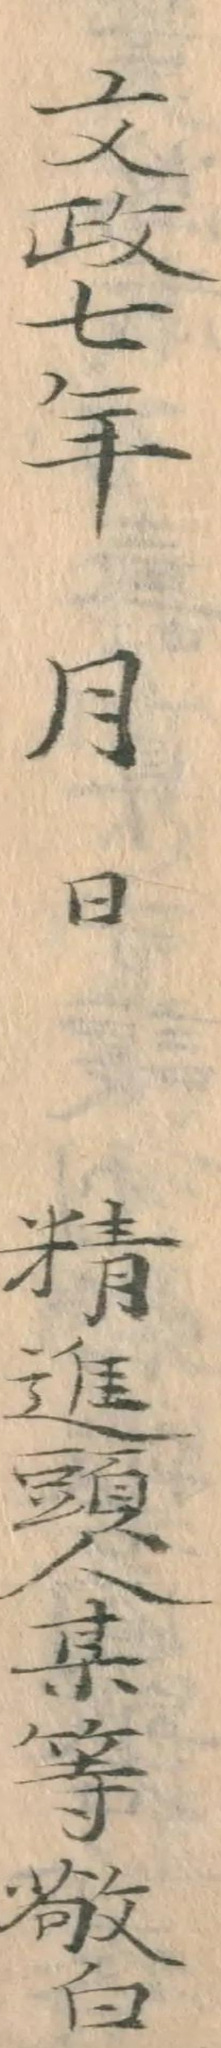文政七年月日精進頭人某等敬白
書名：賀茂社記録. 第72冊
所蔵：国立国会図書館 National Diet Library, JAPAN
